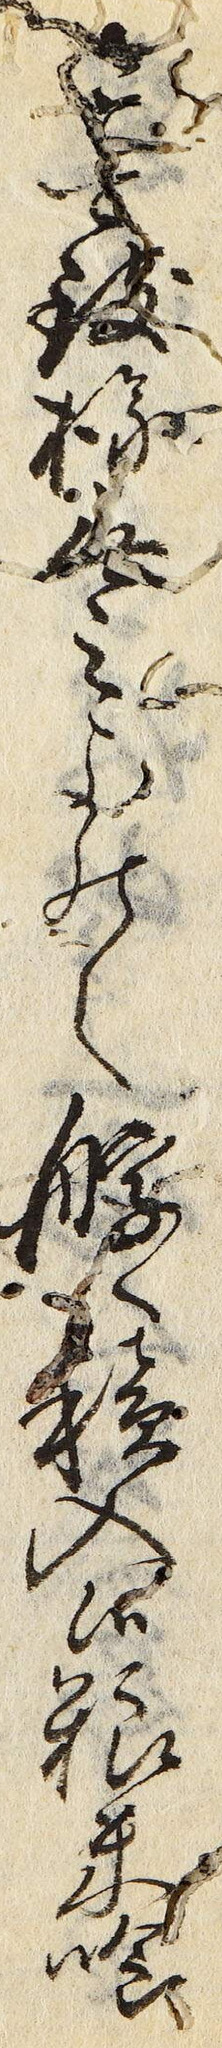致様無之よの〳〵？艀へ積入候粮米喰
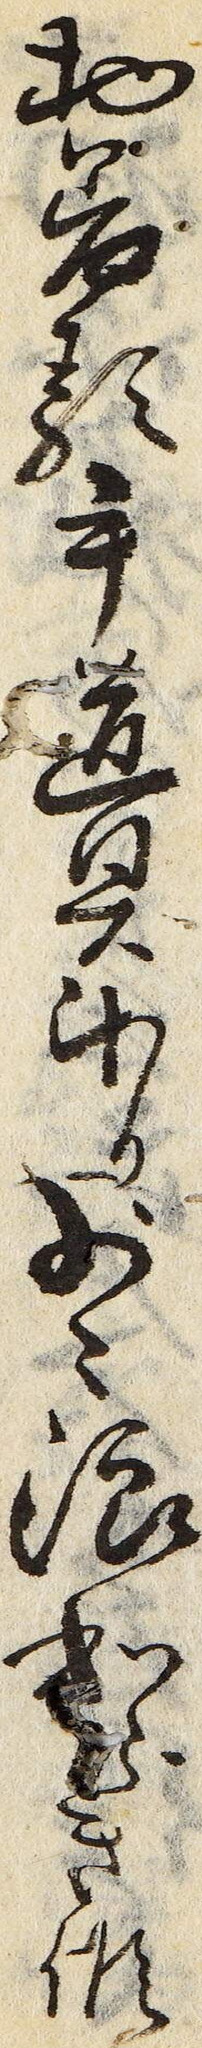物着類手道具計り少々浪和らき候
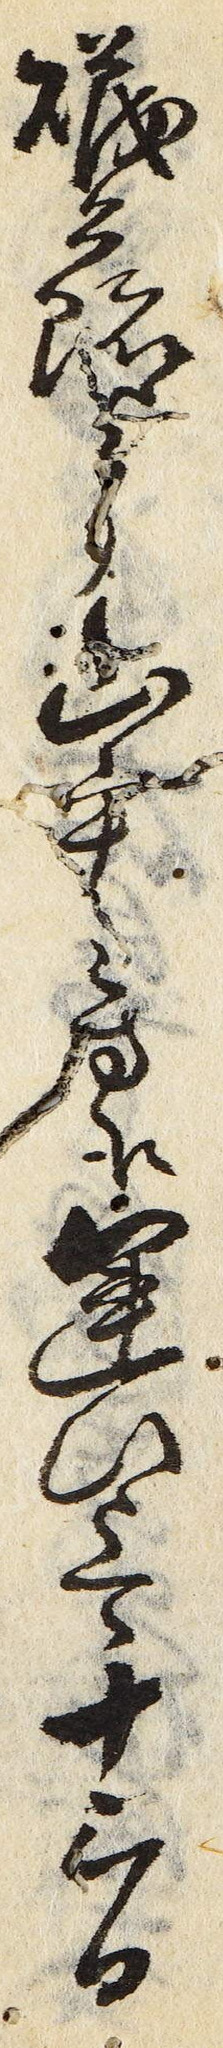磯蔭より山手之方え運ひ上候十三日
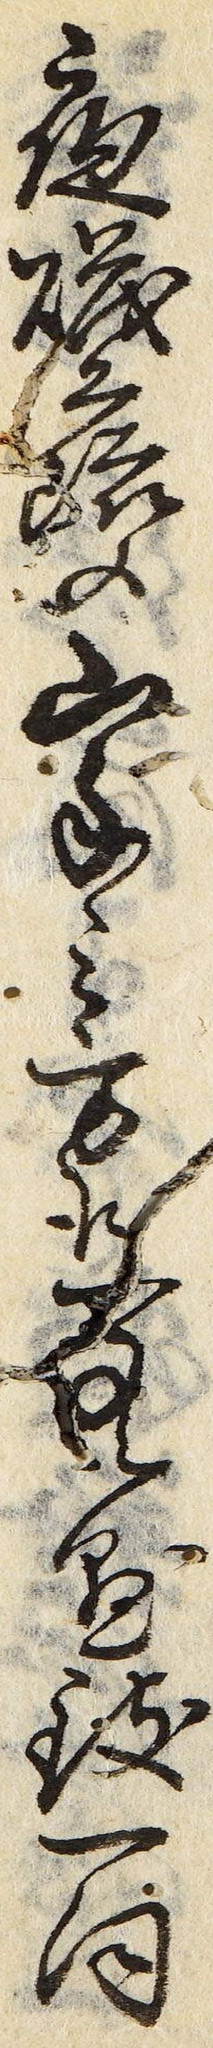夜磯蔭の山手之方え差懸致一同
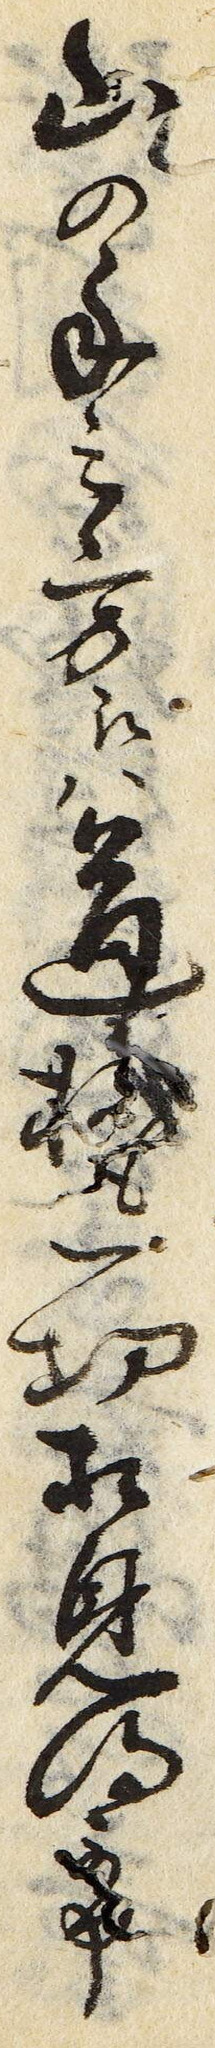山の手之方えハ道も一切相見得不申
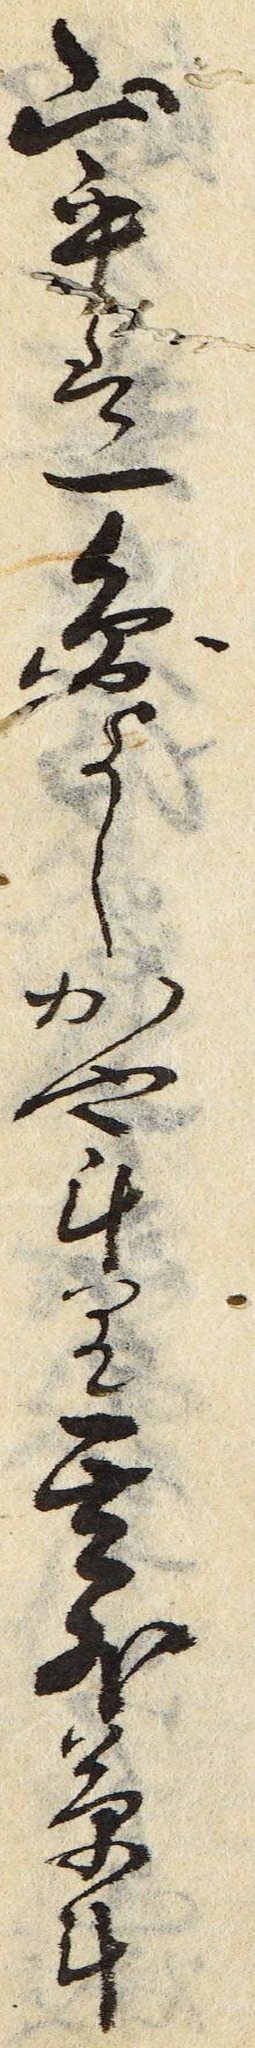山手は一円よしかや計り其外草計
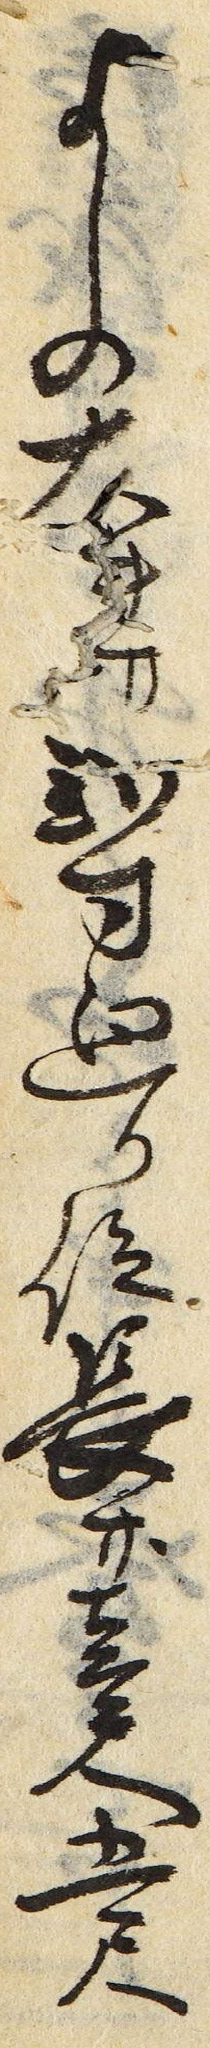よしの大キサ弐寸廻り位長サ壱尺五尺

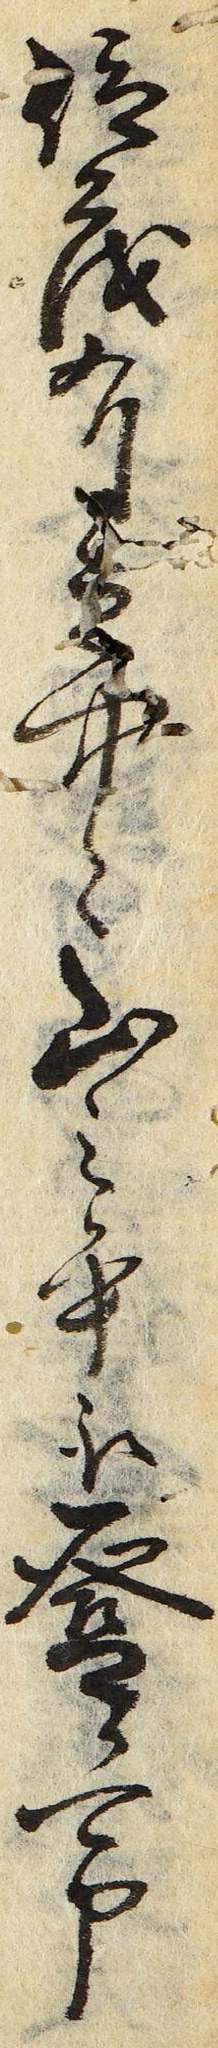位も有之中々山之中え登り可申
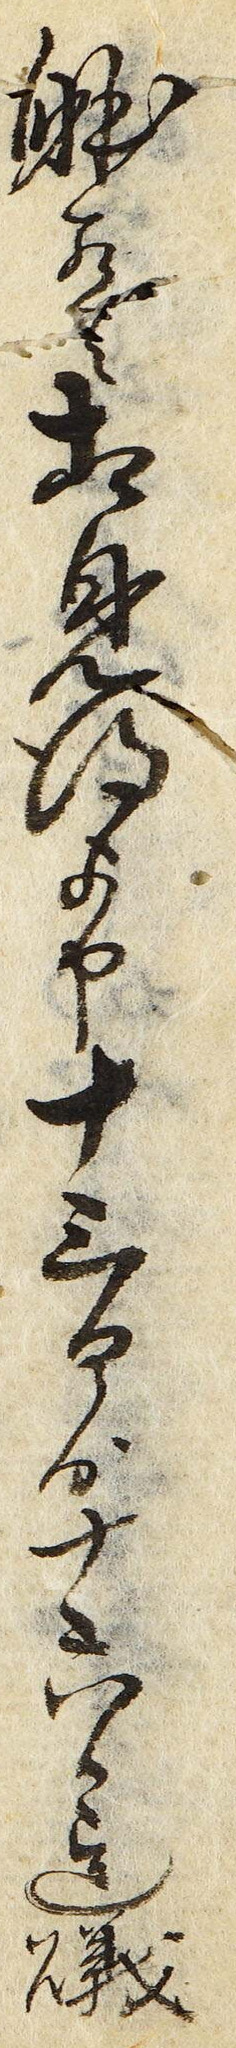体有与相見得不申十三日ゟ十六日迄磯
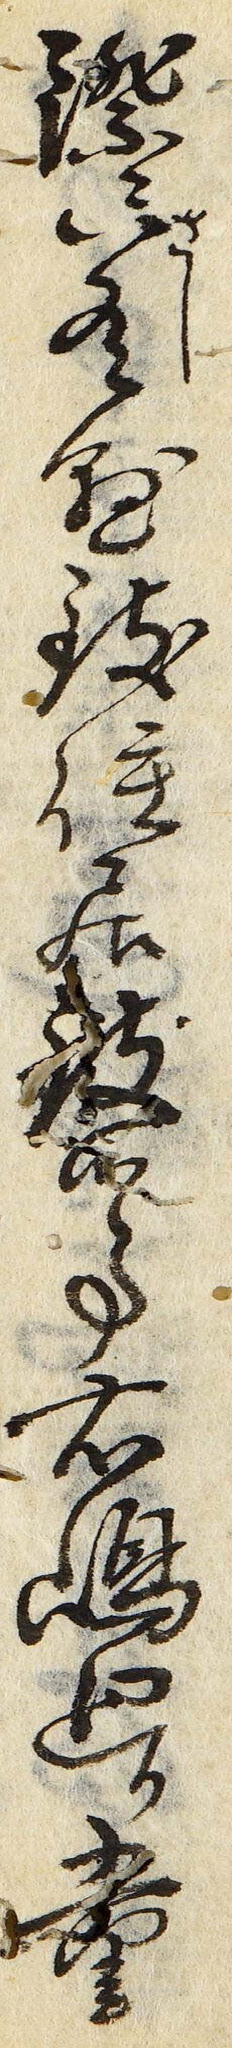際ニ差懸致住居致候事右嶋廻り五里
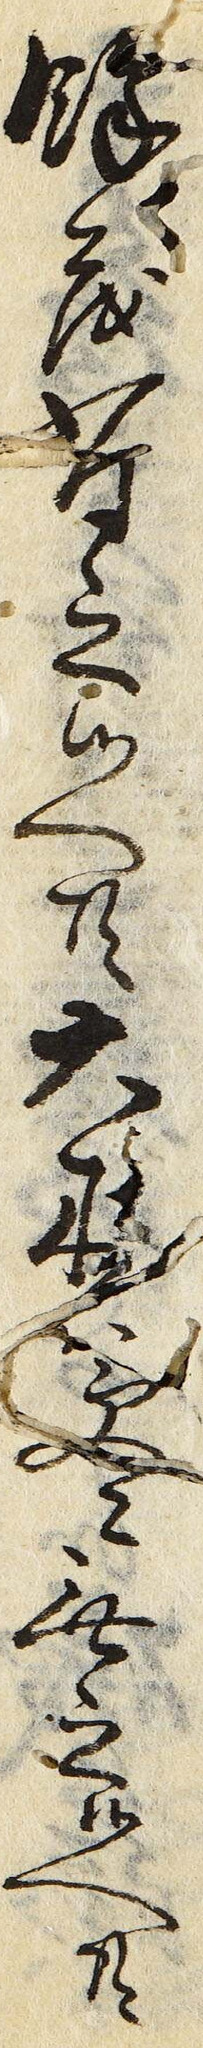余も有之候へ共大木ハ更ニ無之候へ共
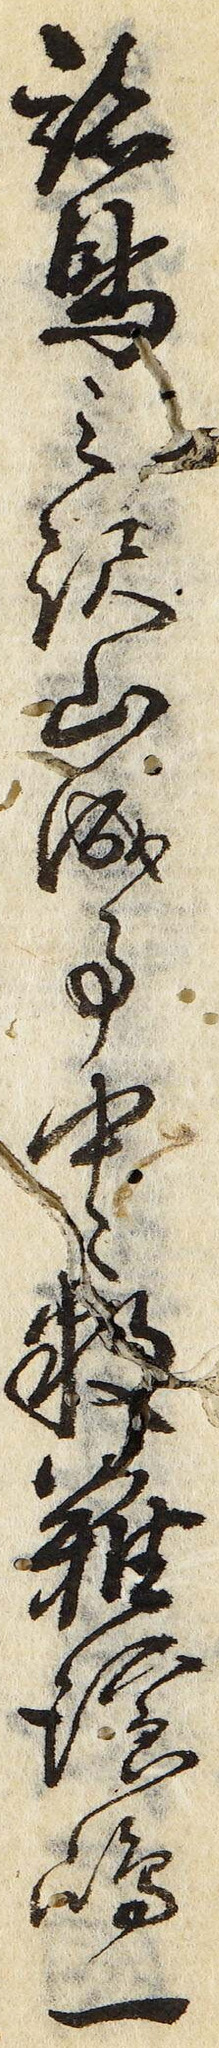諸鳥之沢山成事中々数難演嶋一
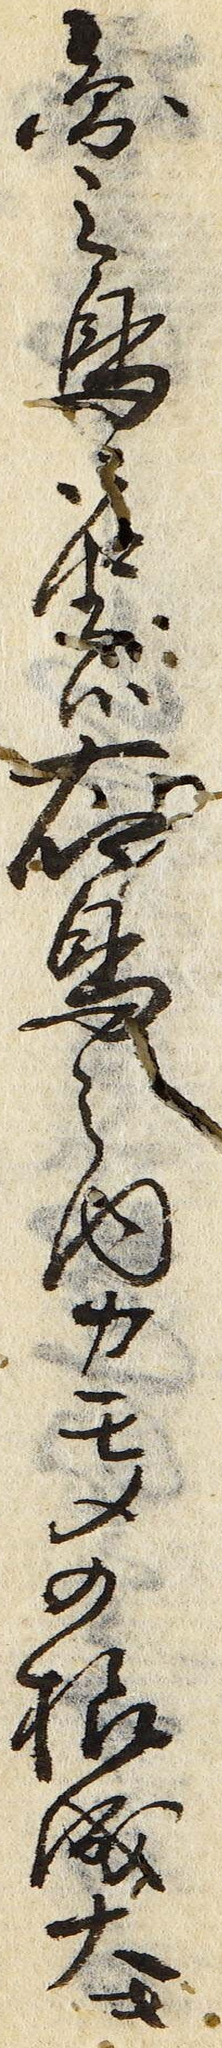円之鳥ニ御座候右鳥之内カモメの様成大キ
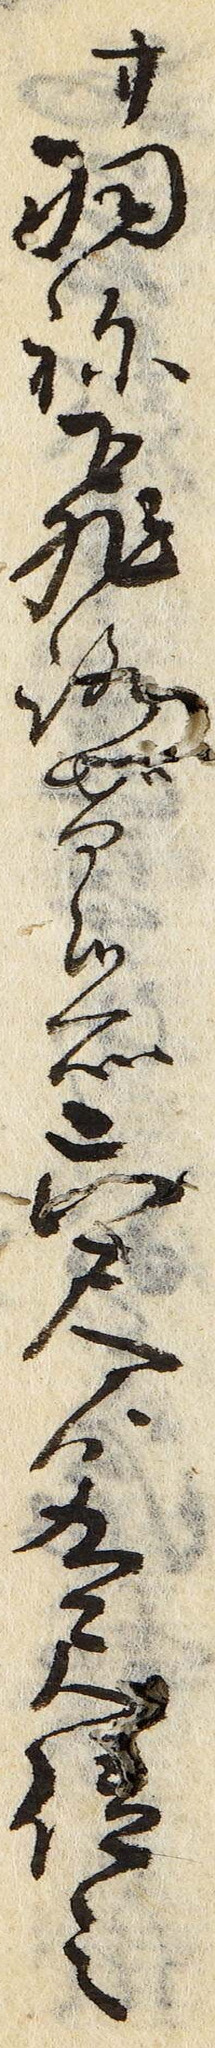サ羽ねひろげ候所六尺ゟ九尺位之
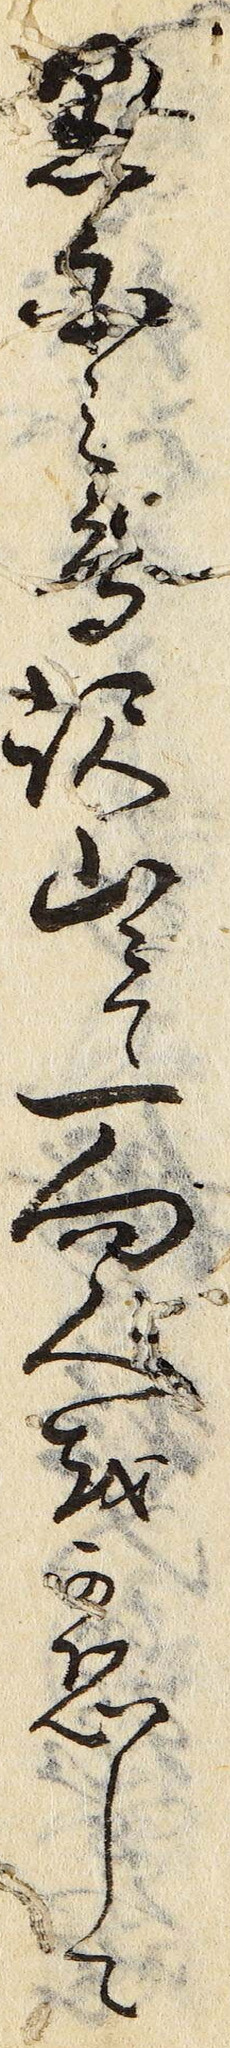黒白之鳥沢山ニて一向人を不恐して
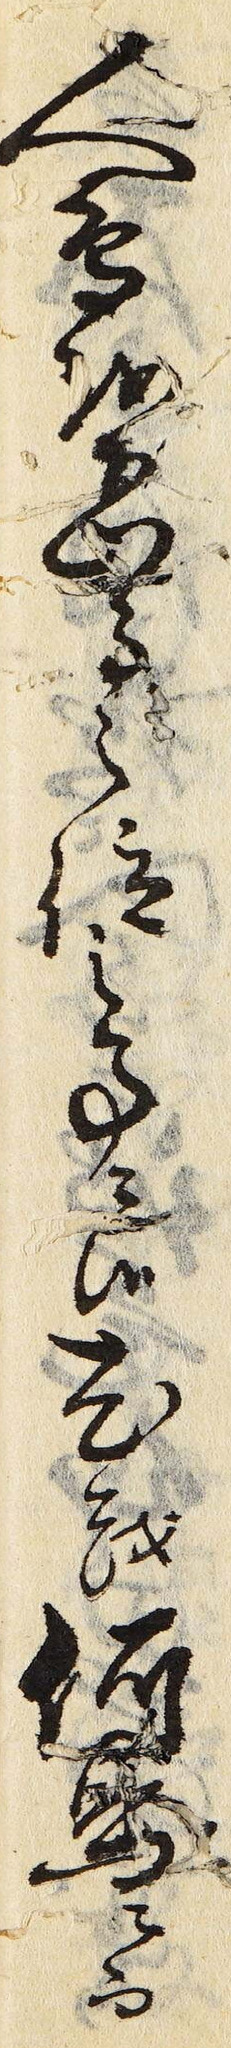人鳥を恐るゝ位之事ニ候尤も何鳥ニ而
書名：阿波幸宝丸漂流記
